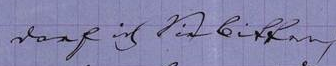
Darf ich Sie bitten,
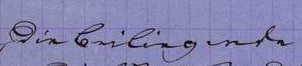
die beiliegende
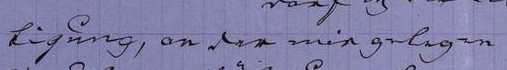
tigung, an der mir gelegen
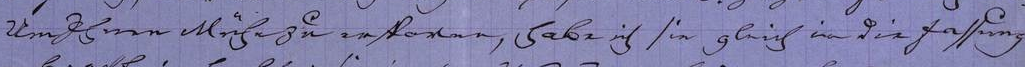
Um Ihnen Mühe zu ersparen, habe ich sie gleich in die Fassung
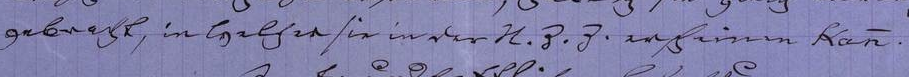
gebracht, in welcher sie in der N.Z.Z. erscheinen kann.
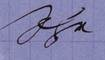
Escher
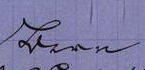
Bern
